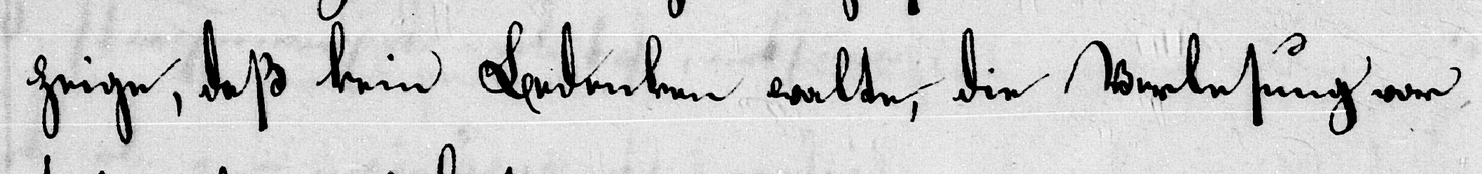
zeige, daß kein Bedenken walte, die Verlesung von
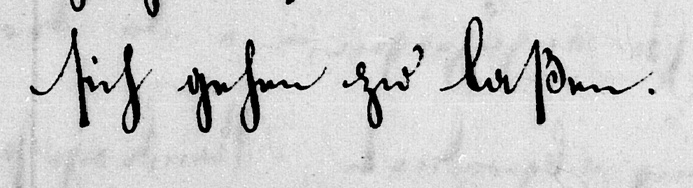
sich gehen zu laßen.
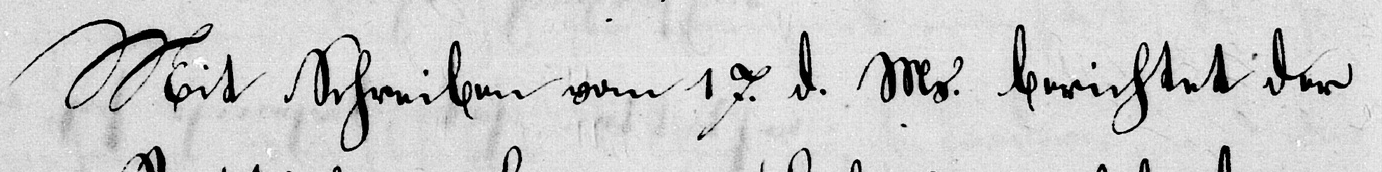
Mit Schreiben vom 17. d. Ms. berichtet der
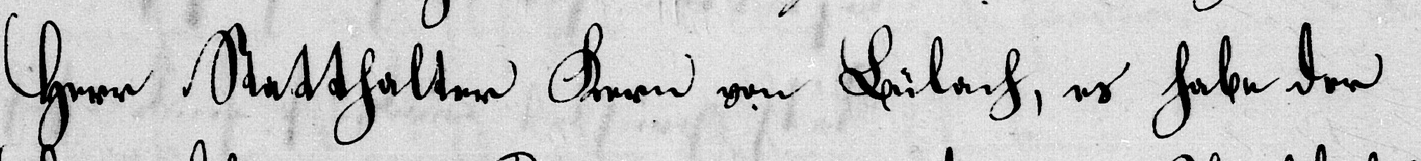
Herr Statthalter Kern von Bülach, es habe der
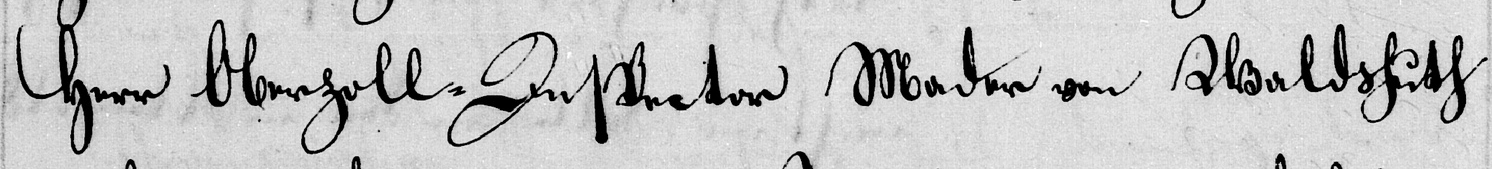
Herr Oberzoll-Inspector Mader von Waldshuth
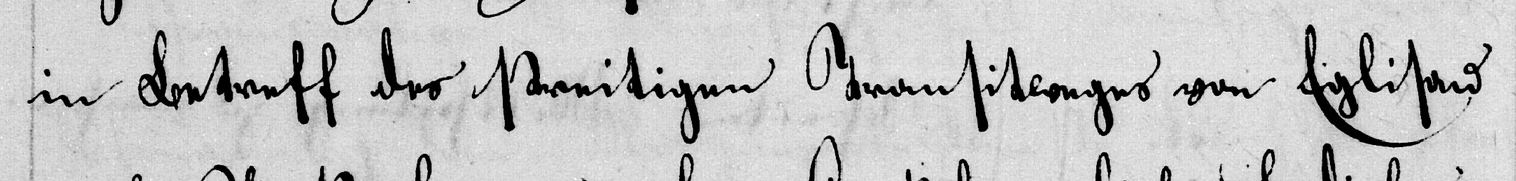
in Betreff des streitigen Transitweges von Eglisau
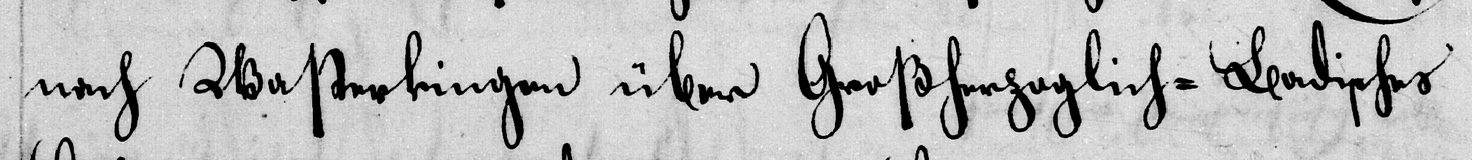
nach Wasterkingen über Großherzoglich-Badisches
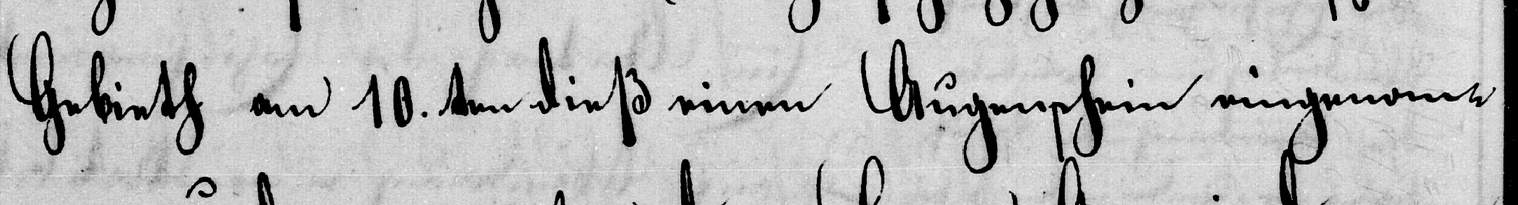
Gebieth am 10.ten dieß einen Augenschein eingenom¬
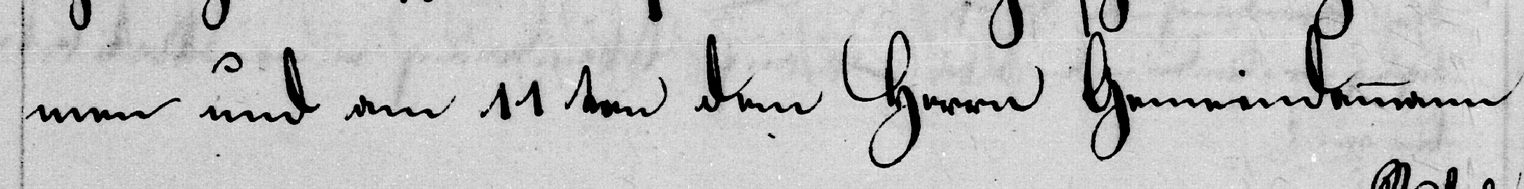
men und am 11ten dem Herrn Gemeindammann
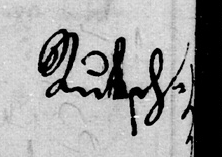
Rutsch-
